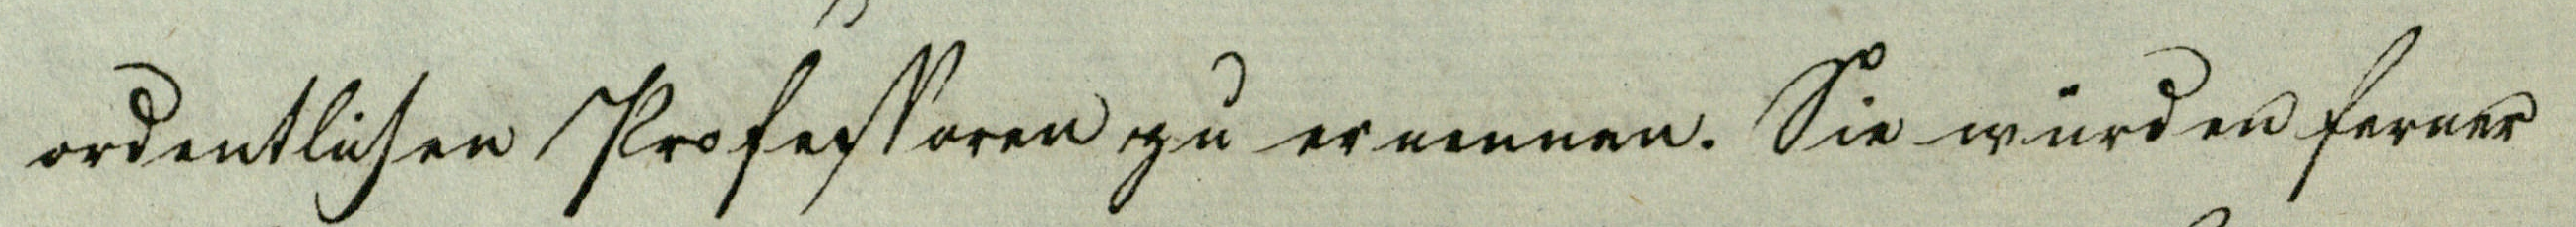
ordentlichen Professoren zu ernennen. Sie würden ferner
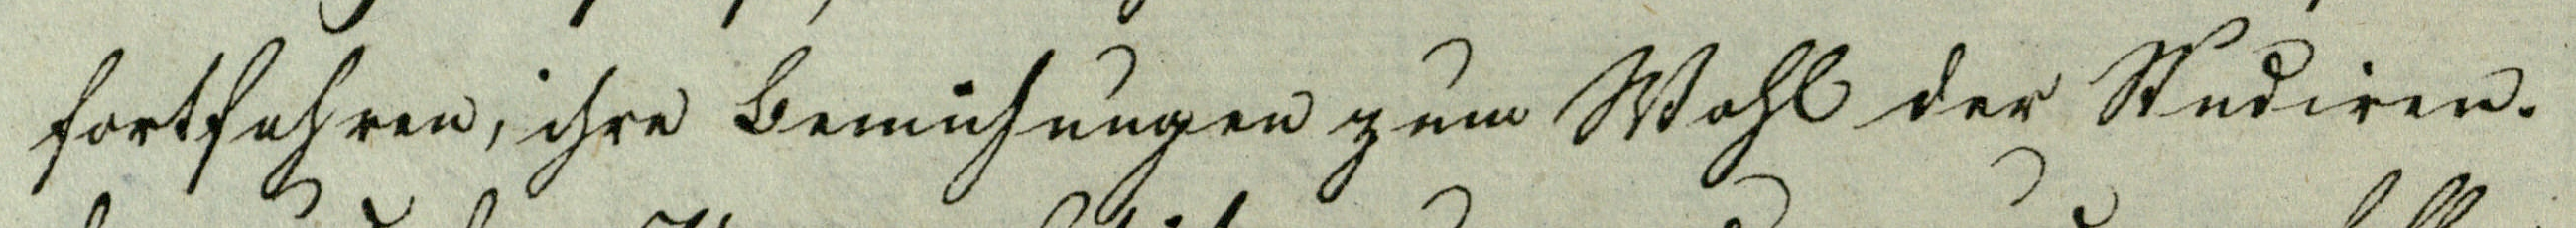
fortfahren, ihre Bemühungen zum Wohl der Studiren¬
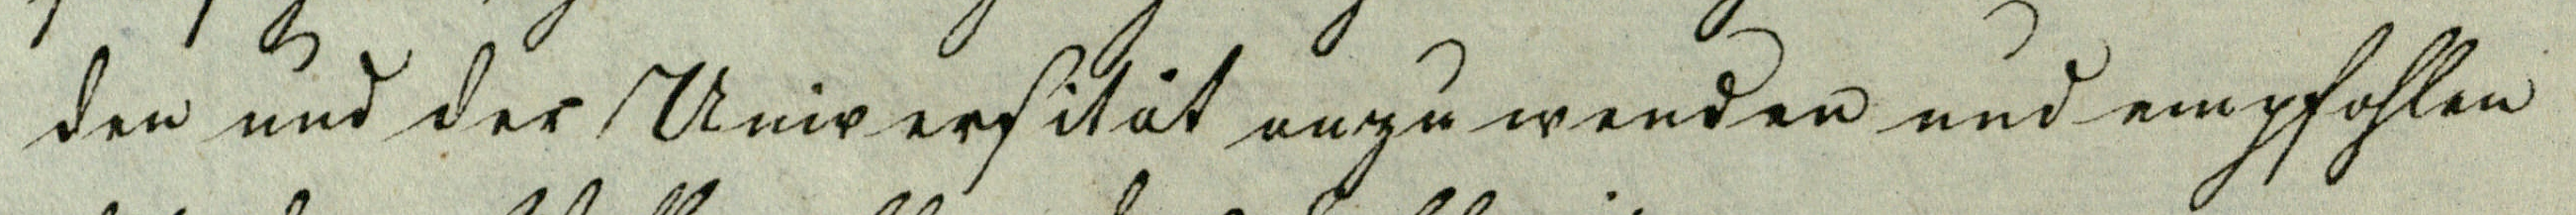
den und der Universität anzuwenden und empfohlen
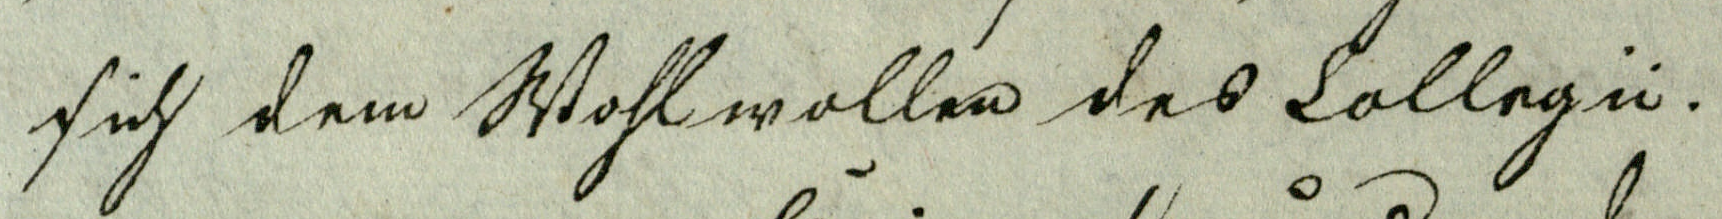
sich dem Wohlwollen des Collegii.
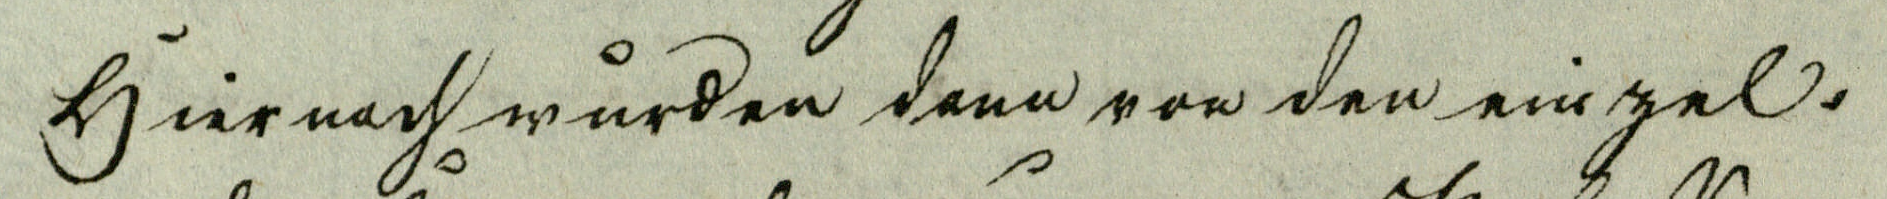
Hiernach wurden dann von den einzel¬
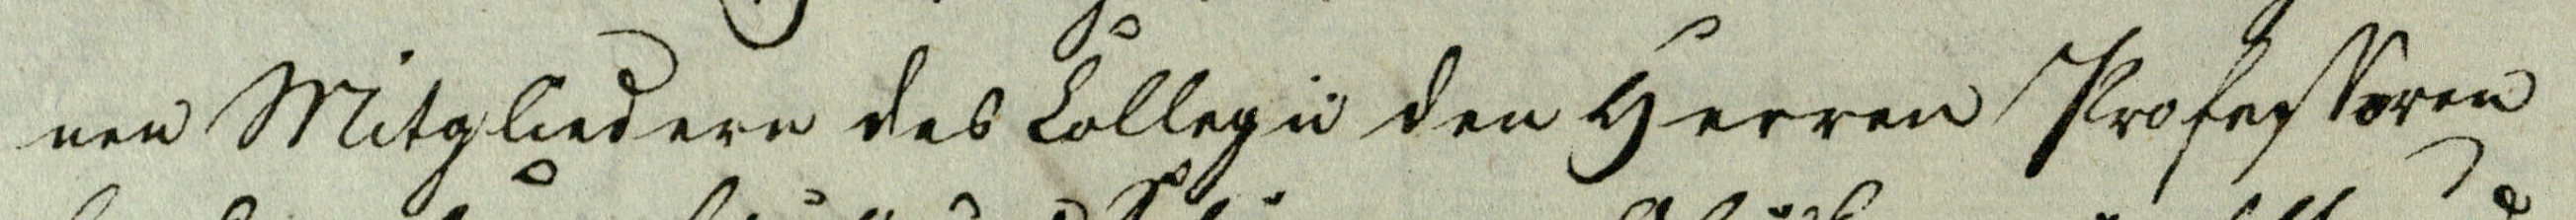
nen Mitgliedern des Collegii den Herren Professoren
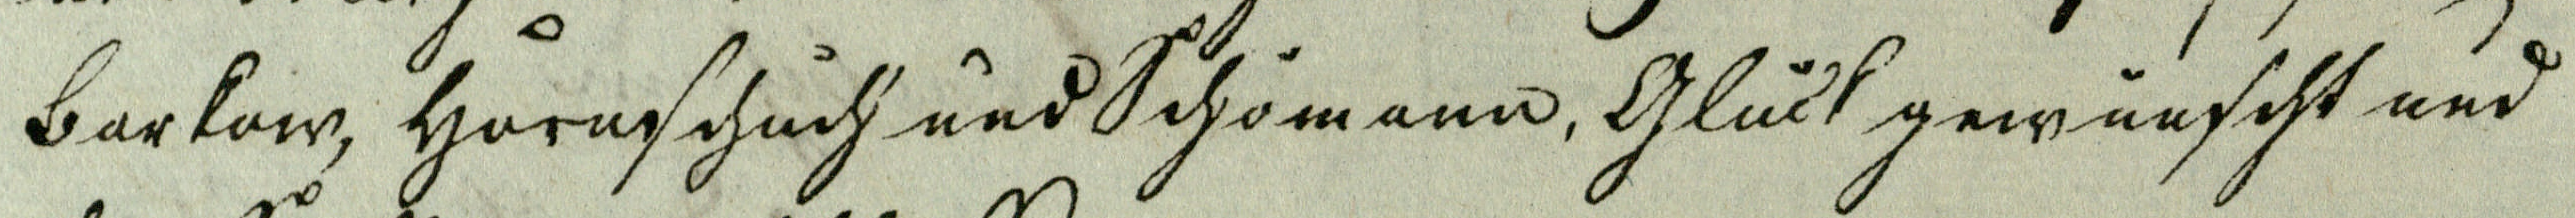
Barkow, Hornschuch und Schömann, Glück gewünscht und
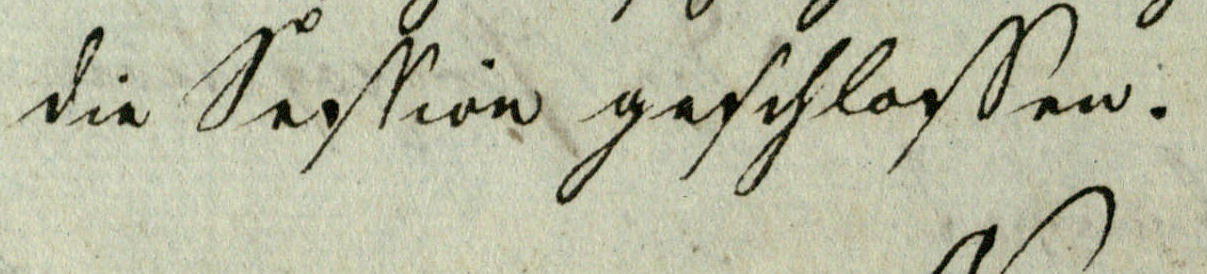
die Session geschlossen.
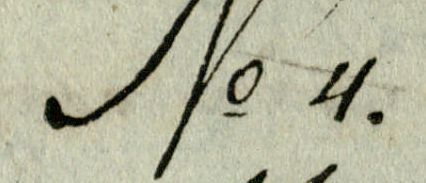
Nº 4.
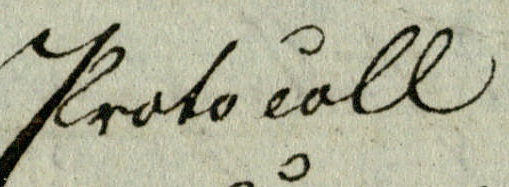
Protocoll
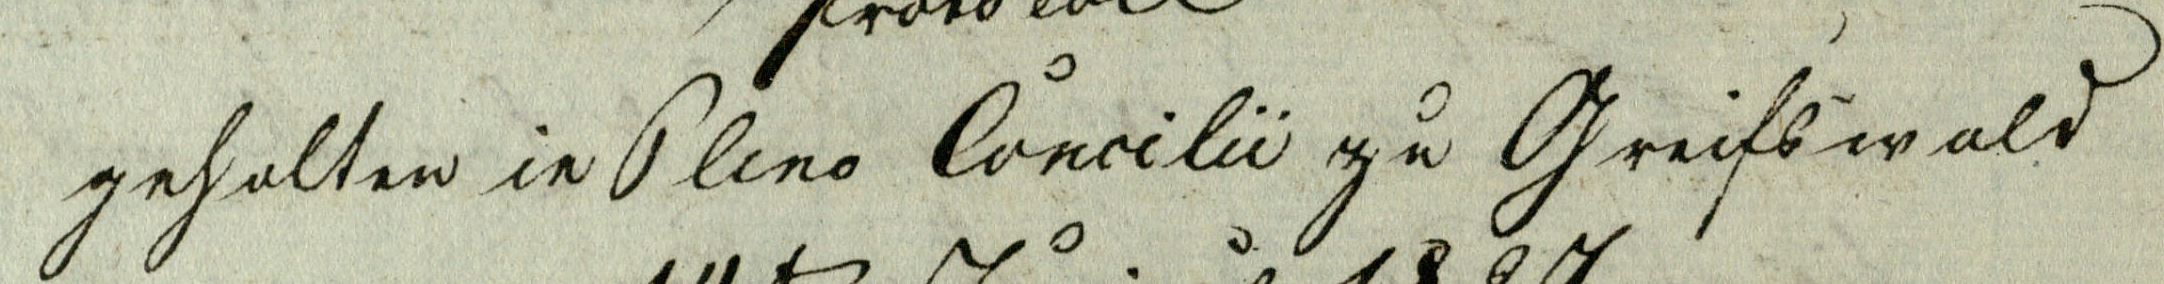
gehalten in Pleno Concilii zu Greifswald
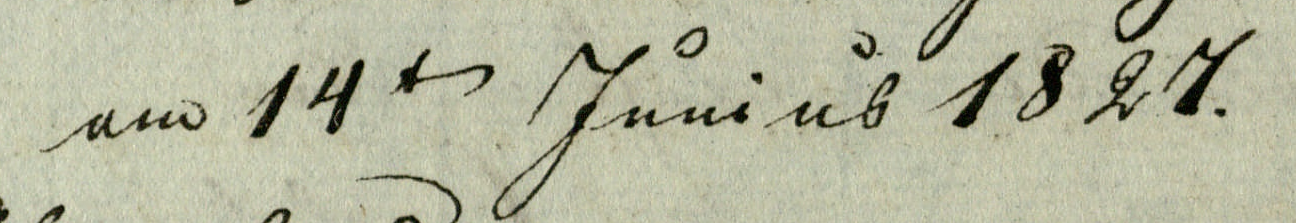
am 14ten Junius 1827.
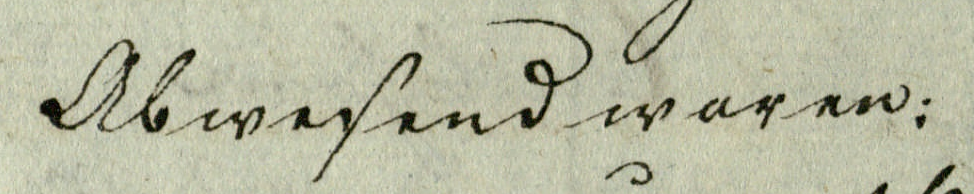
Abwesend waren:
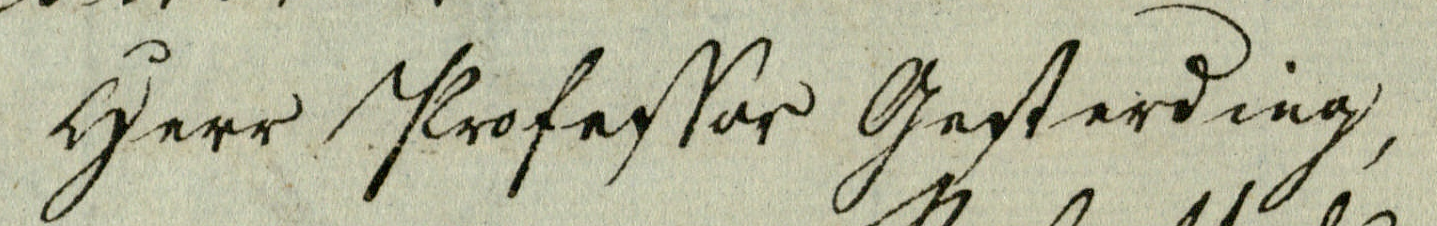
Herr Professor Gesterding,
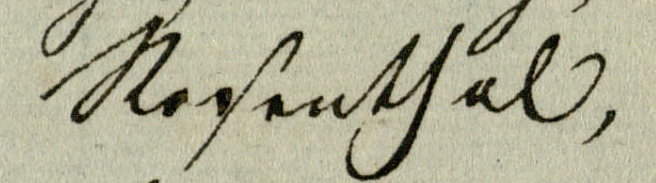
Rosenthal,
